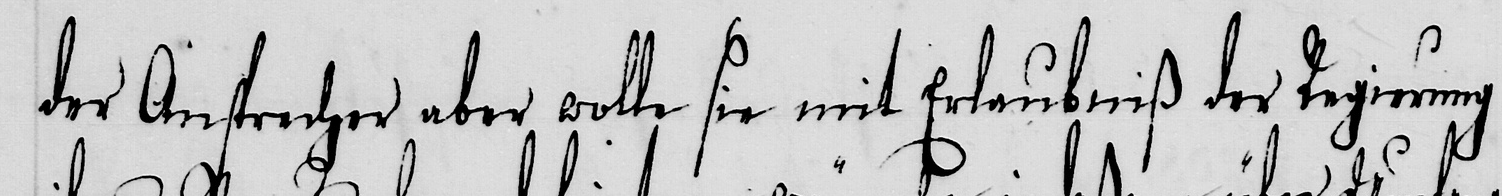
der Ansprecher aber wolle sie mit Erlaubniß der Regierung
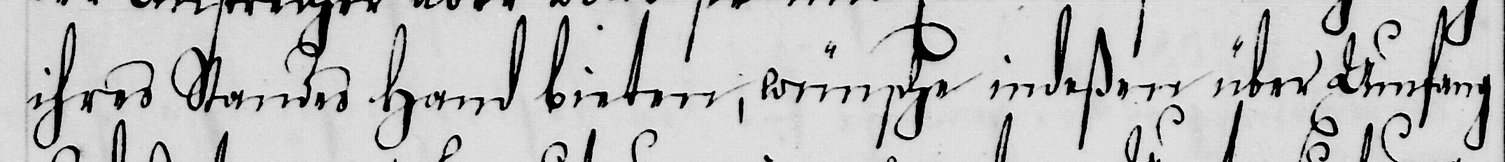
ihres Standes Hand bieten, wünsche indeßen über Umfang
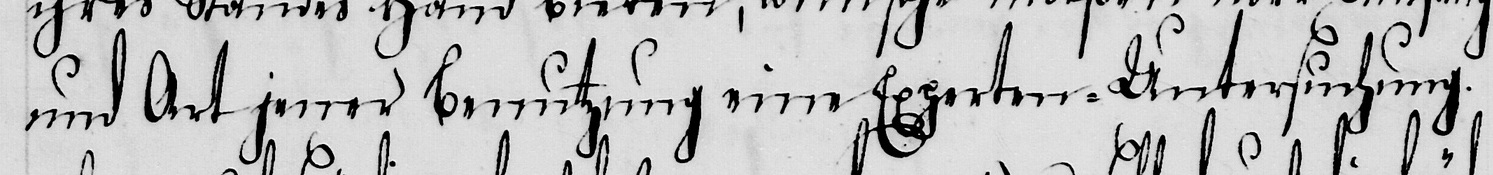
und Art jener Benutzung eine Experten-Untersuchung.
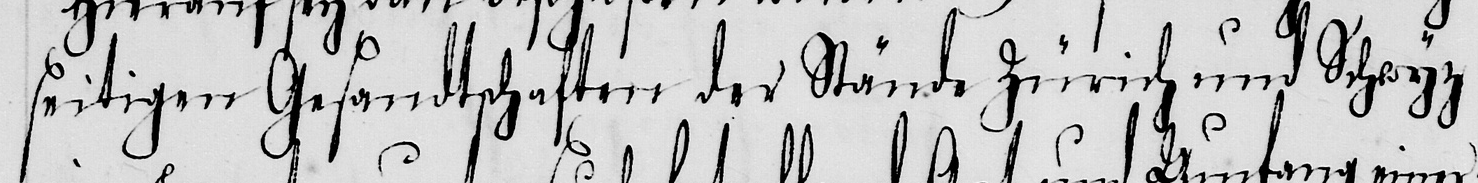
seitigen Gesandtschaften der Stände Zürich und Schwyz
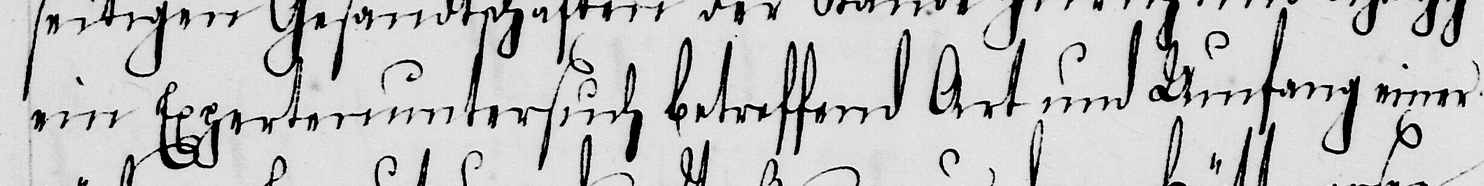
ein Expertenuntersuch betreffend Art und Umfang einer
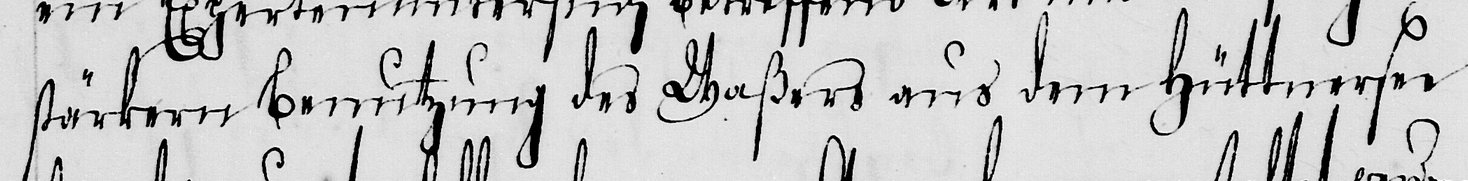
stärkern Benutzung des Waßers aus dem Hüttensee
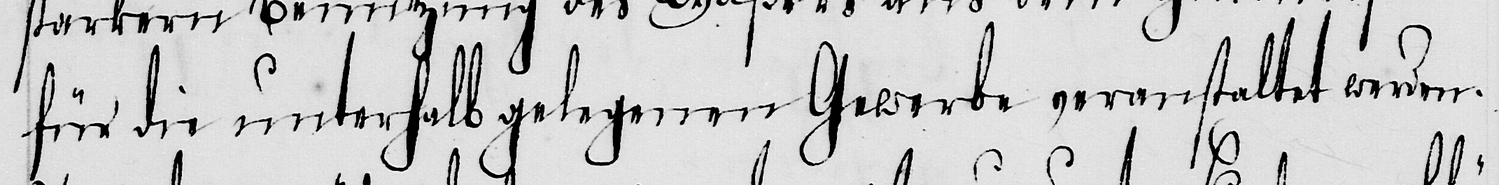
für die unterhalb gelegenen Gewerbe veranstaltet werden.
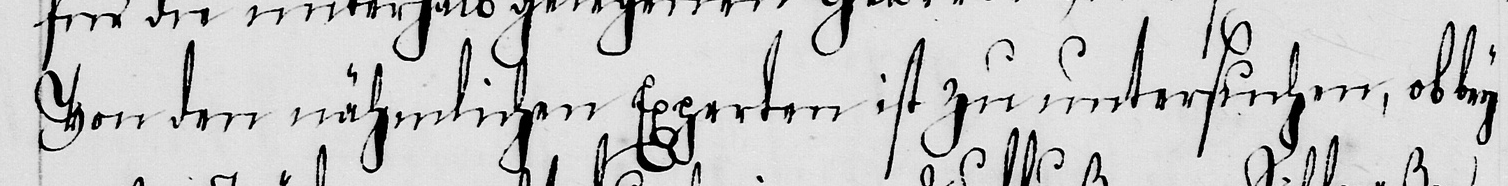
Von den nähmlichen Experten ist zu untersuchen, ob
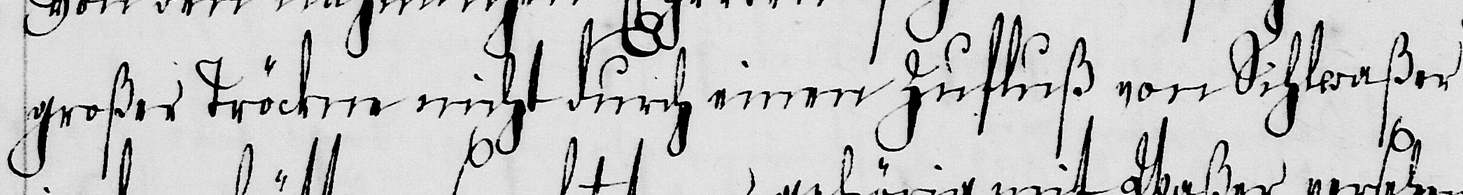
großer Tröckne nicht durch einen Zufluß von Sihlwaßer
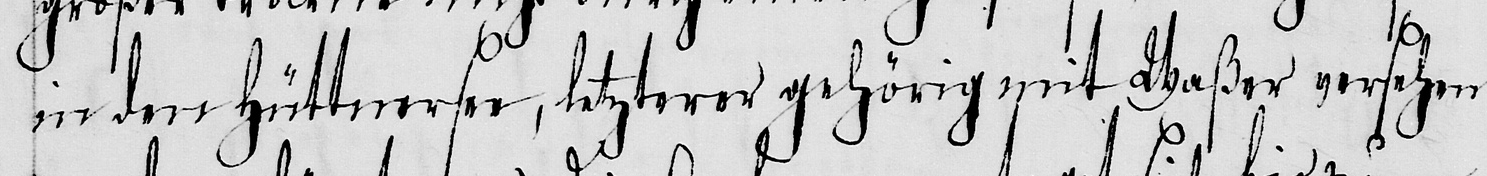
in den Hüttenersee, letzterer gehörig mit Waßer versehen
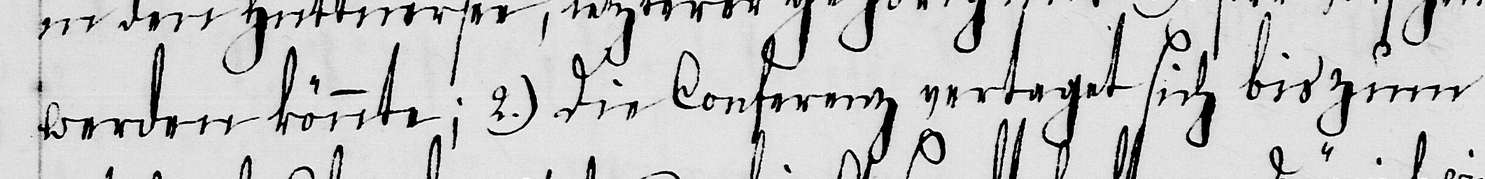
werden könnte; 2.) Die Conferenz vertaget sich bis zum
